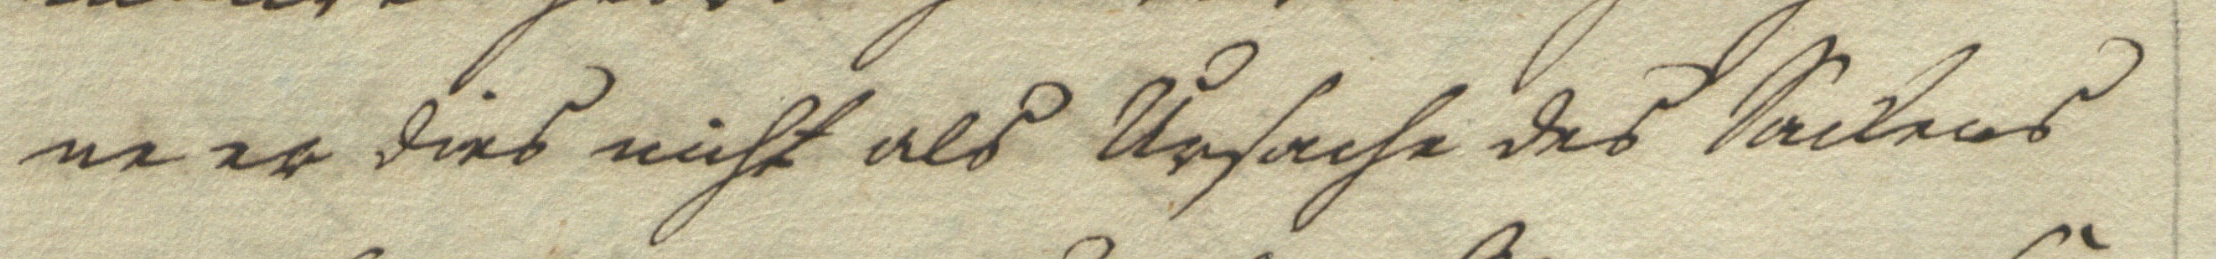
ne er dies nicht als Ursache des Sackens
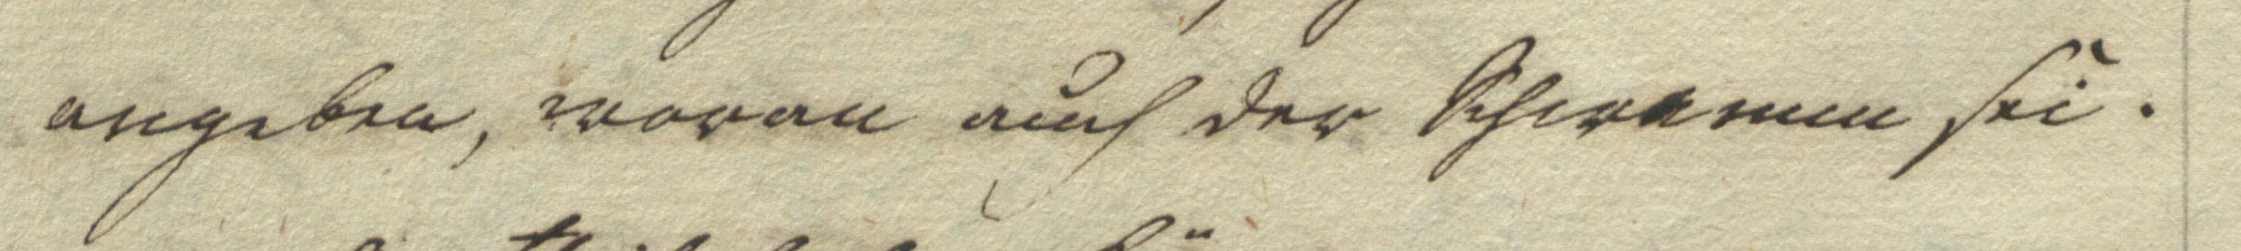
angeben, woran auch der Schwamm sei¬
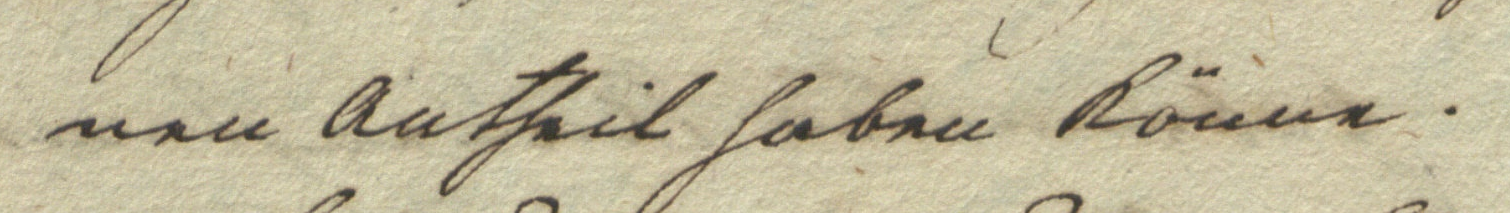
nen Antheil haben könne.
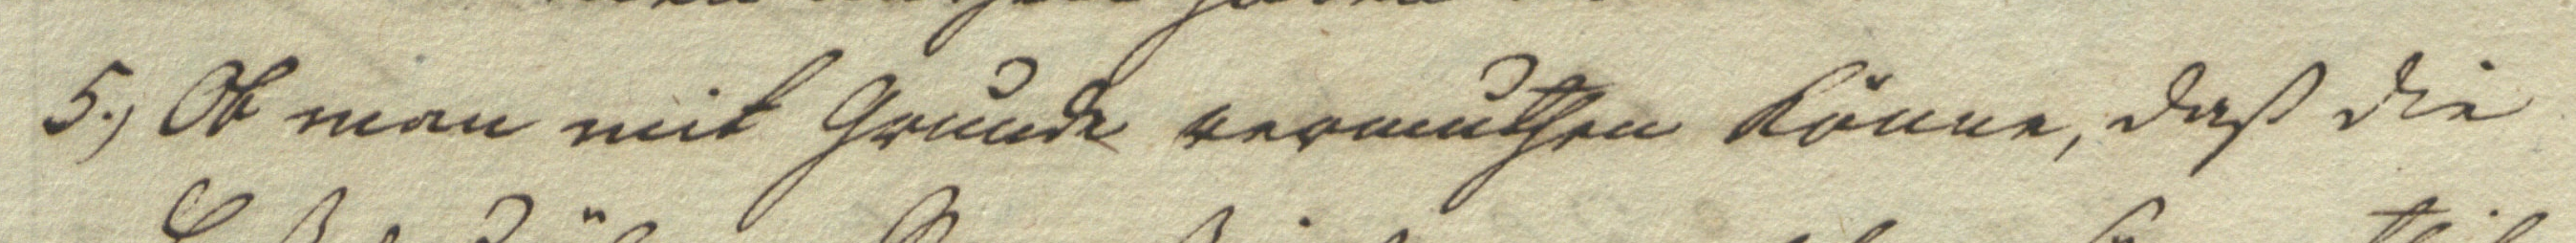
5., Ob man mit Grunde vermuthen könne, daß die
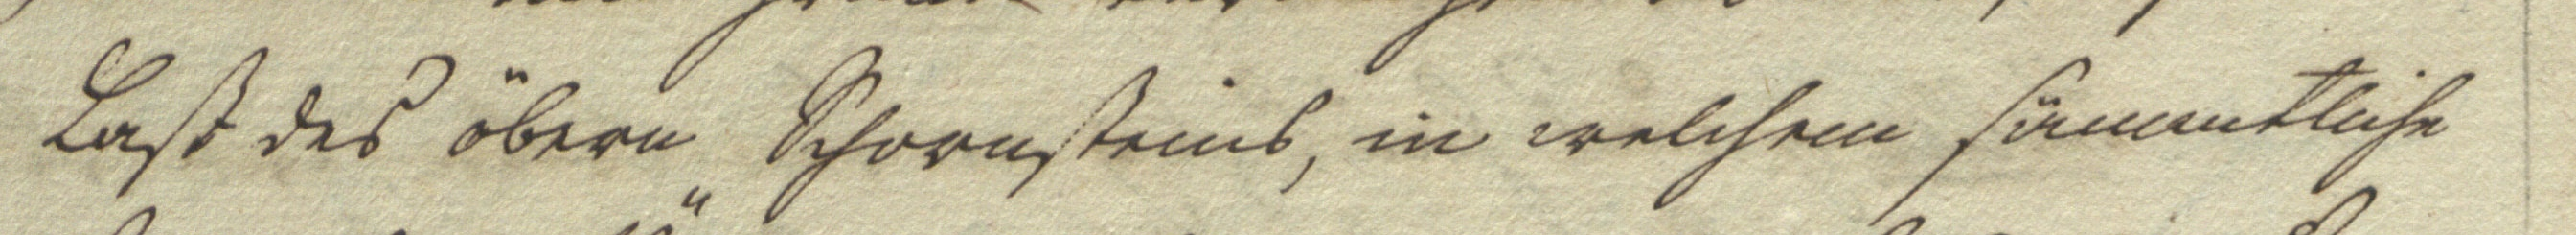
Last des öbern Schornsteins, in welchem sämmtliche
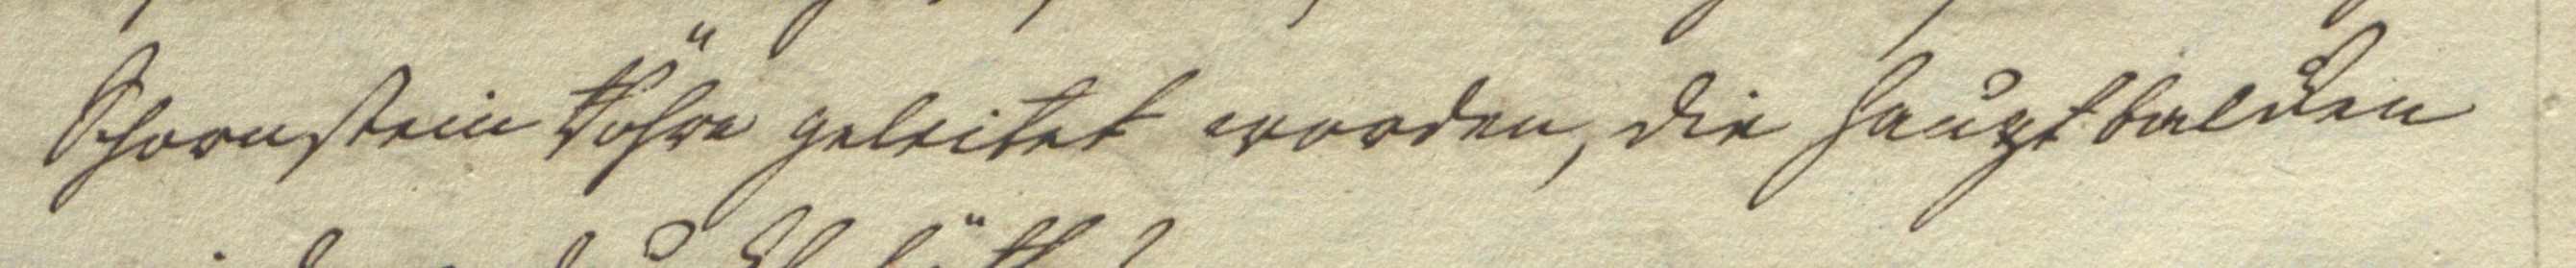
Schornstein Röhre geleitet worden, die Hauptbalcken
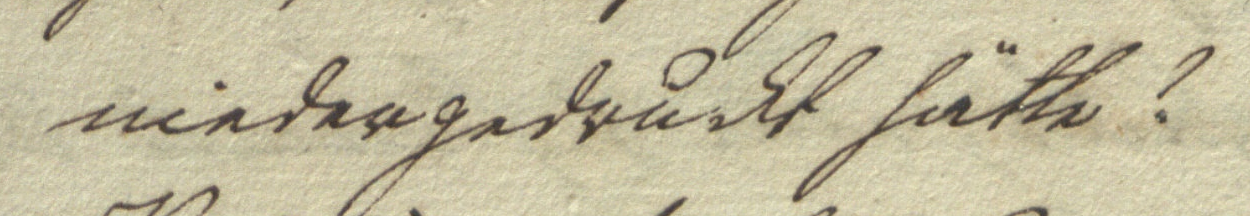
niedergedruckt hätte?
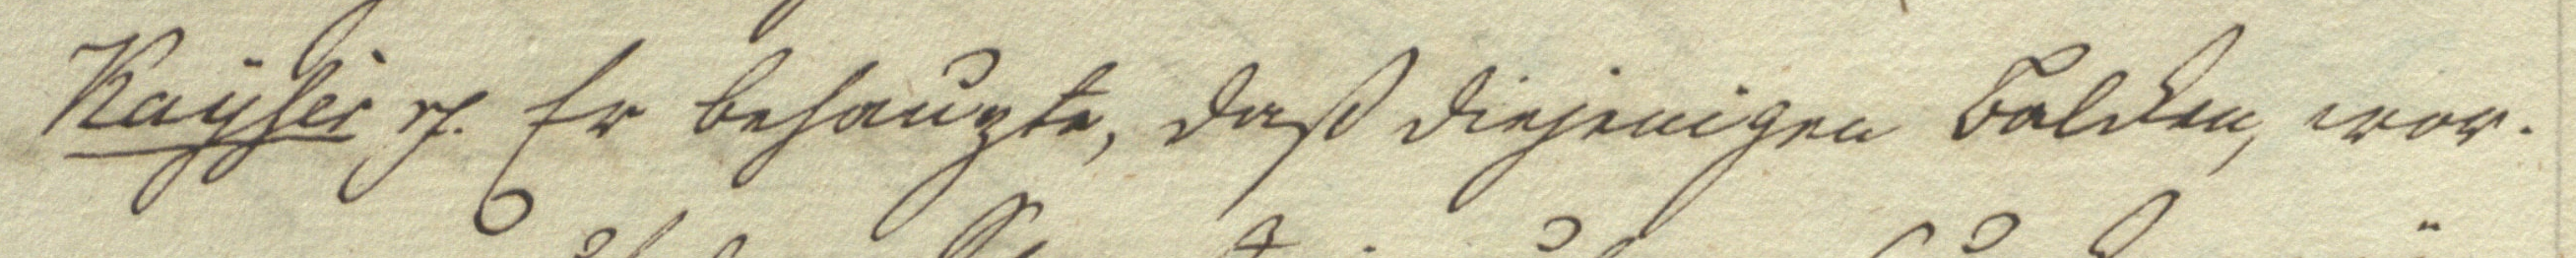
Kaÿser rf. Er behaupte, daß diejenigen Balcken, wor¬
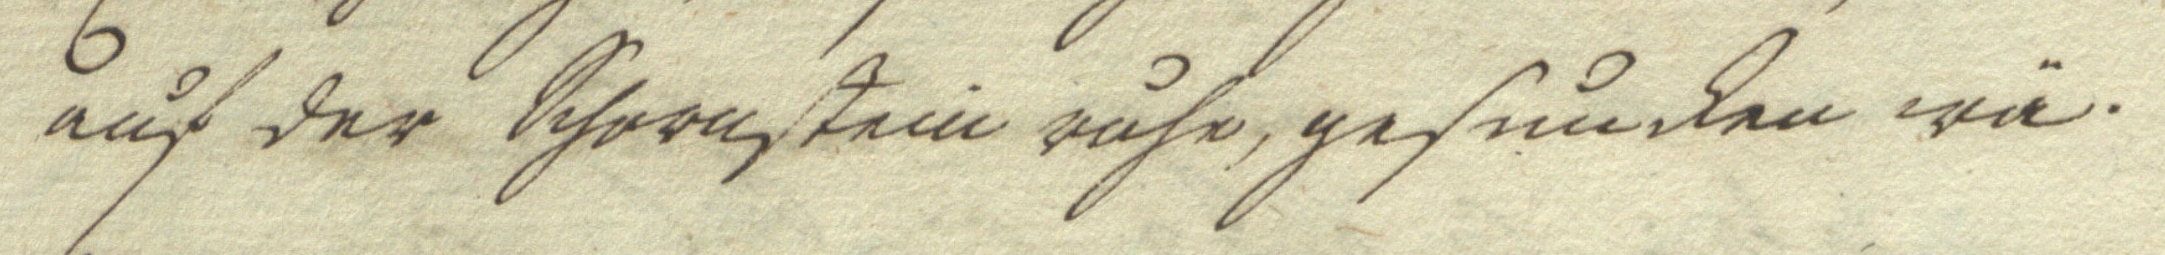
auf der Schornsteine ruhe, gesuncken wä¬
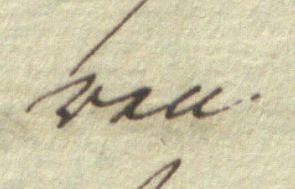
ren.
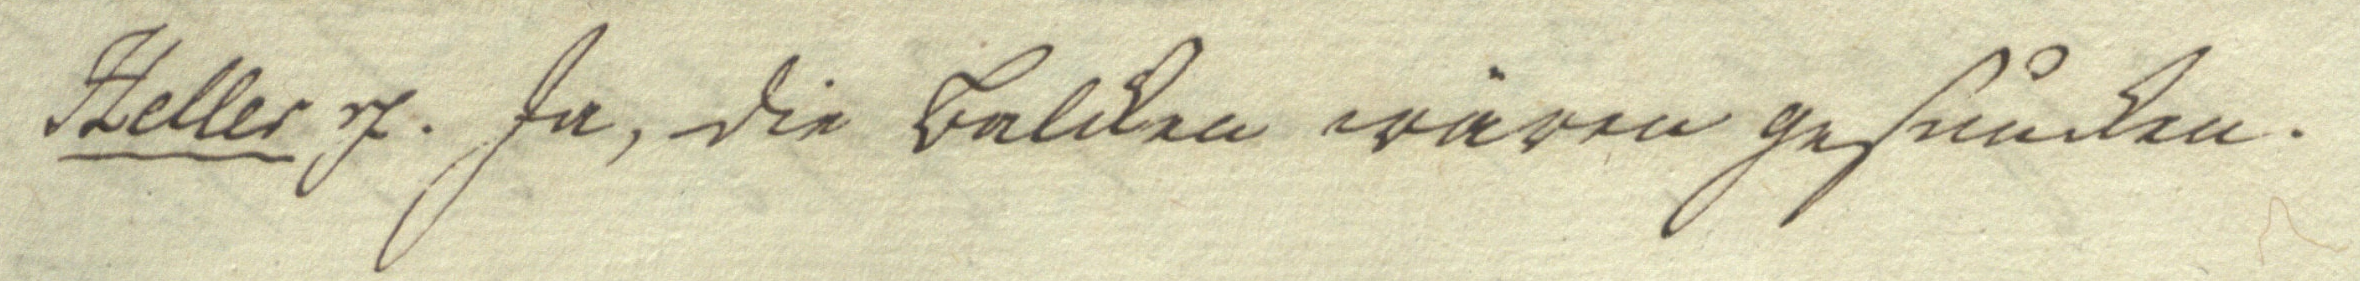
Heller rf. Ja, die Balcken wären gesuncken.
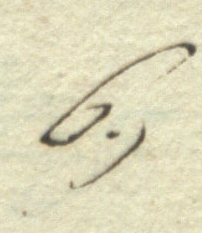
6.,
